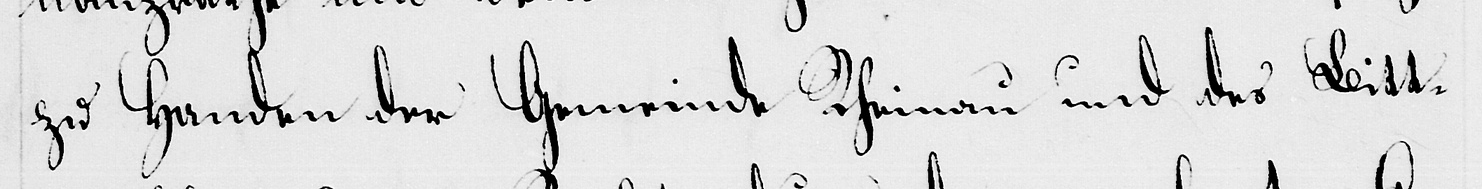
zu Handen der Gemeinde Rheinau und des Bitt¬
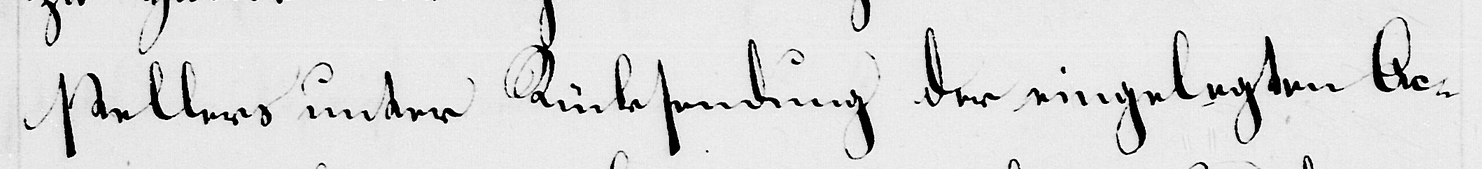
stellers unter Rücksendung der eingelegten Ac¬
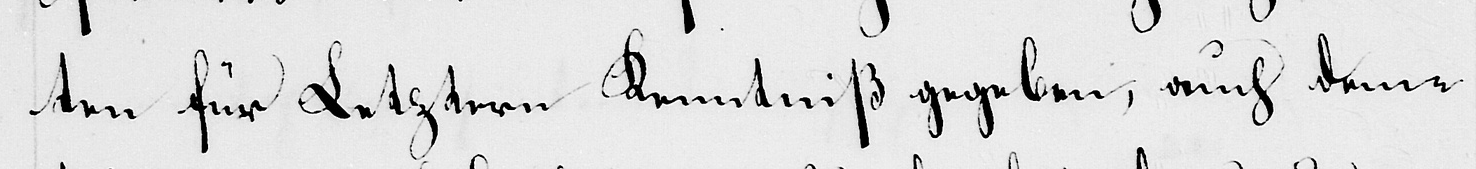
ten für Letztern Kenntniß gegeben, auch dem¬
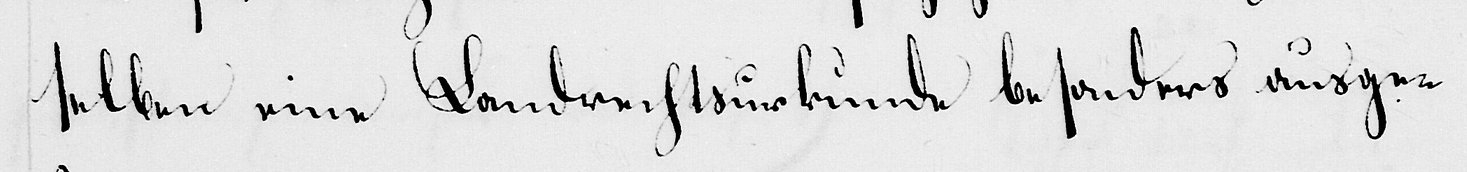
selben eine Landrechtsurkunde besonders ausge¬
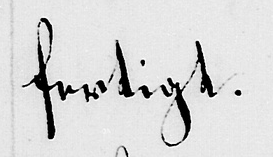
fertigt.
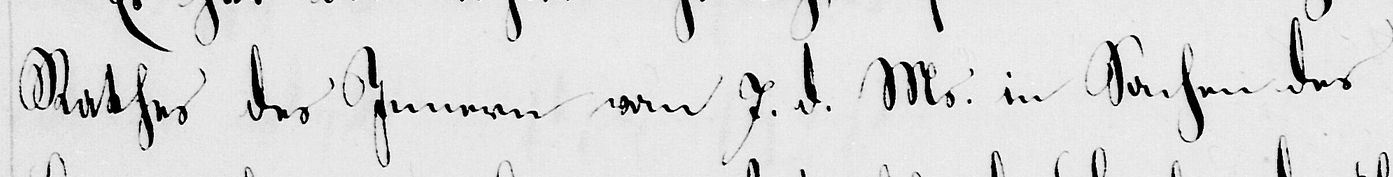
Rathes des Innern vom 7. d. Ms. in Sachen des
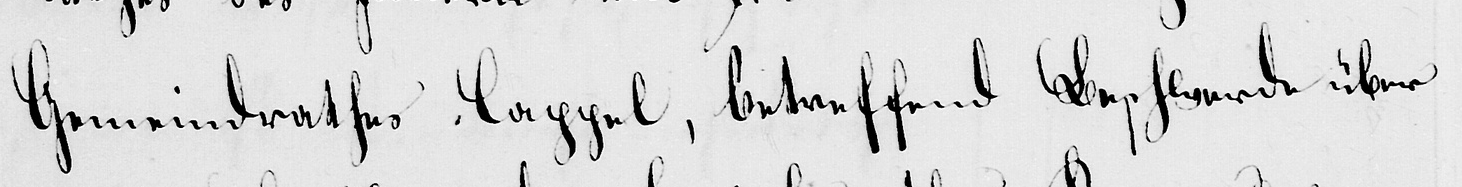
Gemeindrathes Cappel, betreffend Beschwerde über
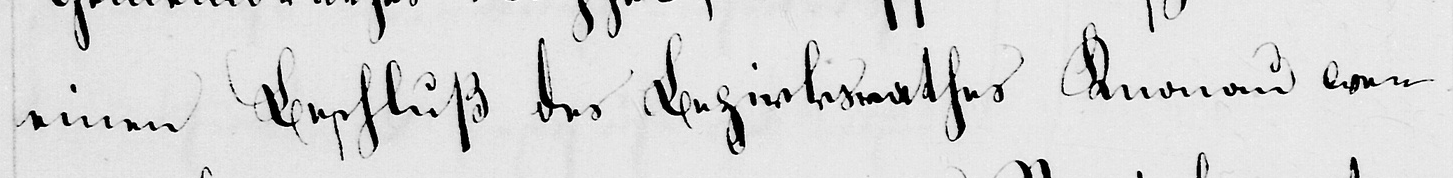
einen Beschluß des Bezirksrathes Knonau we¬
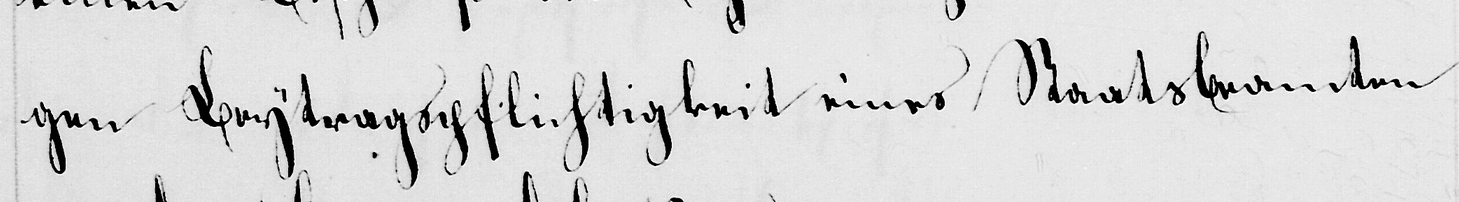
gen Beytragspflichtigkeit eines Staatsbeamten
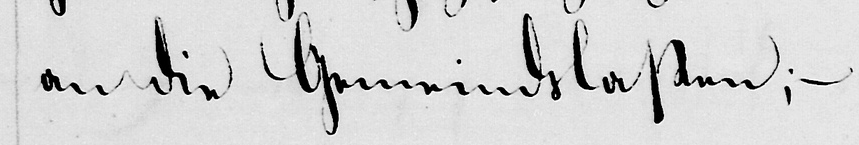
an die Gemeindslasten; –
